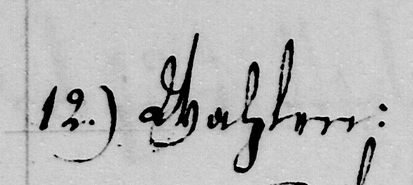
12.) Wahlen:
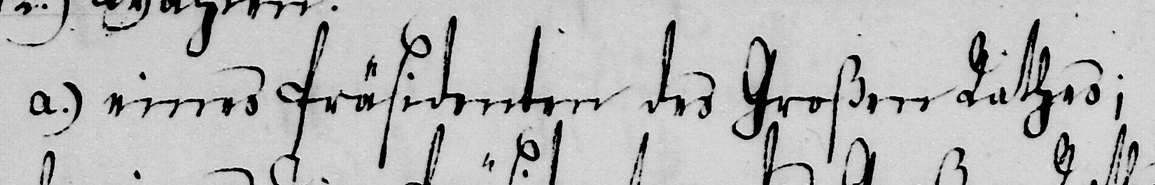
a.) eines Präsidenten des Großen Rathes;
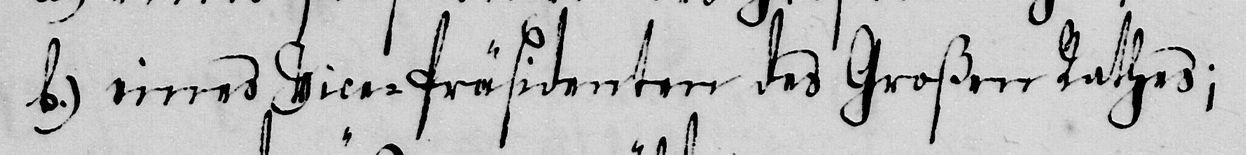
b.) eines Vice-Präsidenten des Großen Rathes;
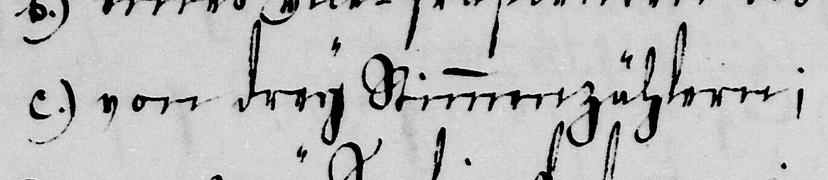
c.) von drey Stimmenzählern;
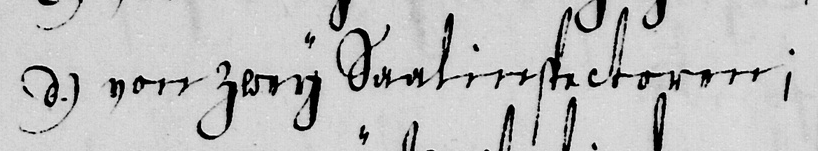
d.) von zwey Saalinspectoren;
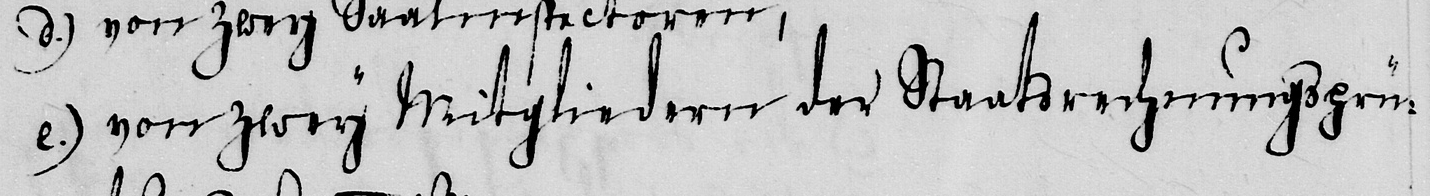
e.) von zwey Mitgliedern der Staatsrechnungsprü¬
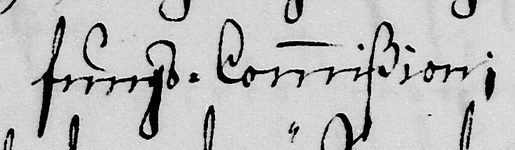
fungs-Commißion;
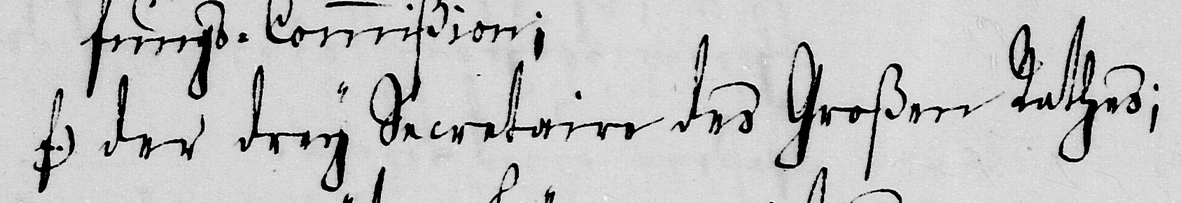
f.) der drey Secretaire des Großen Rathes;
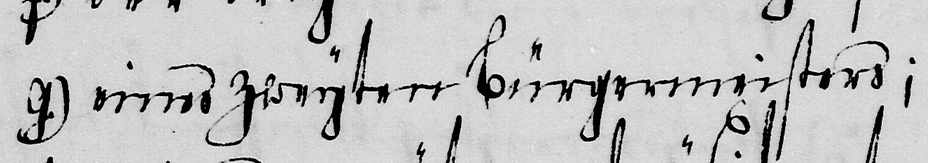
g.) eines zweyten Bürgermeisters;
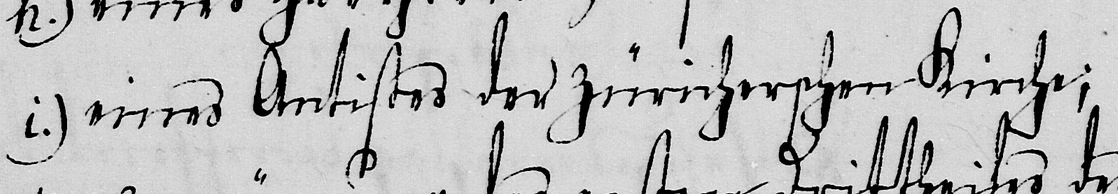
i.) eines Antistes der zürcherischen Kirche;
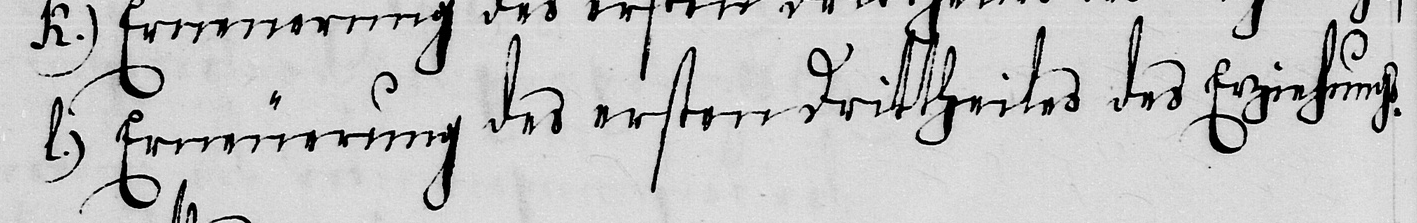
l.) Erneuerung des ersten Drittheiles des Erziehung¬
